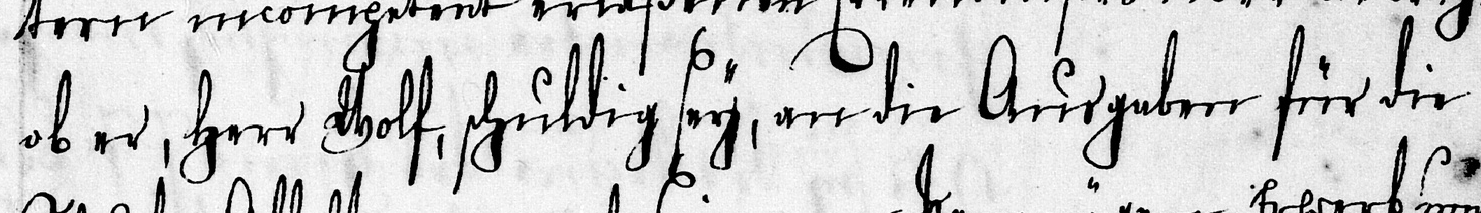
Herr Wolf, schuldig sey, an die Ausgaben für die
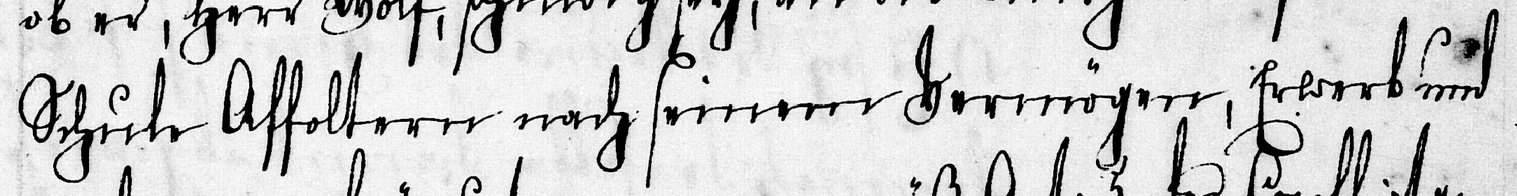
Schule Affoltern nach seinem Vermögen, Erwerb und
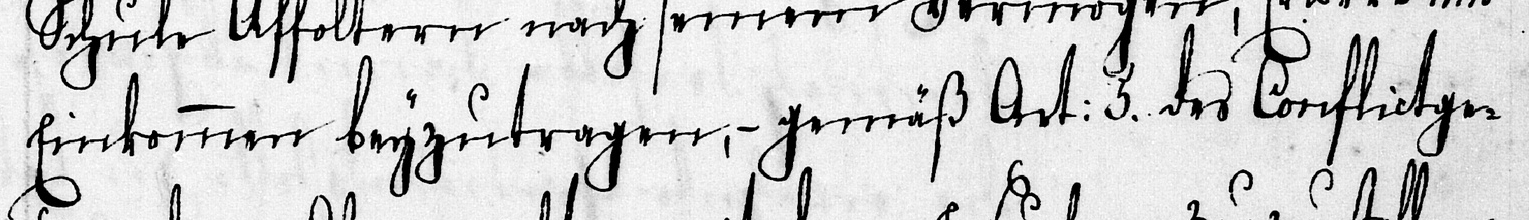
Einkommen beyzutragen, – gemäß Art: 5. des Conflictges¬
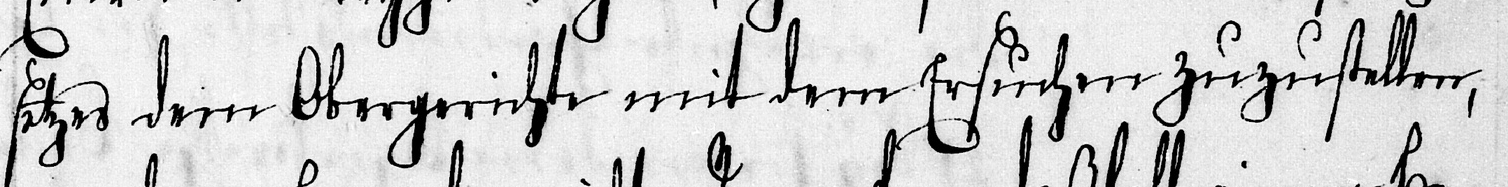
etzes dem Obergerichte mit dem Ersuchen zuzustellen,
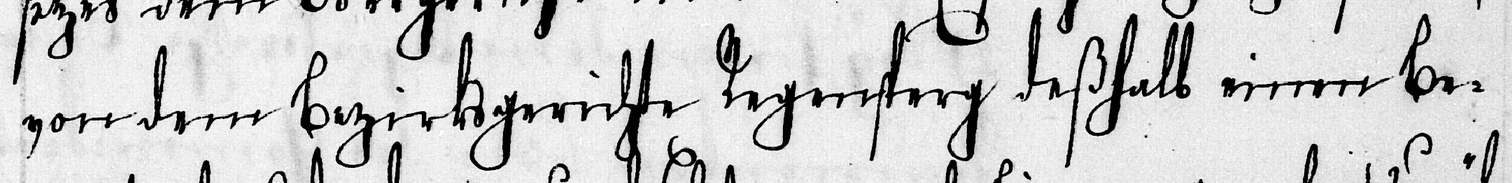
von dem Bezirksgerichte Regensperg deßhalb einen Be¬
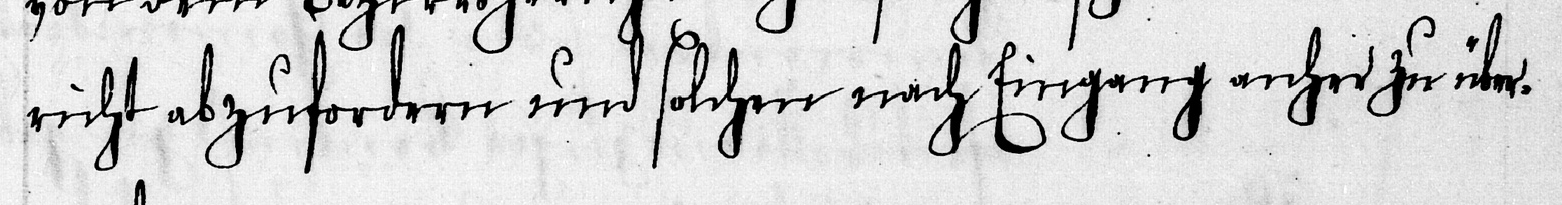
richt abzufordern und solchen nach Eingang anher zu über¬
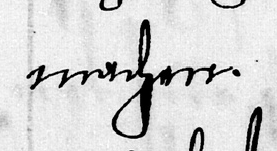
machen.
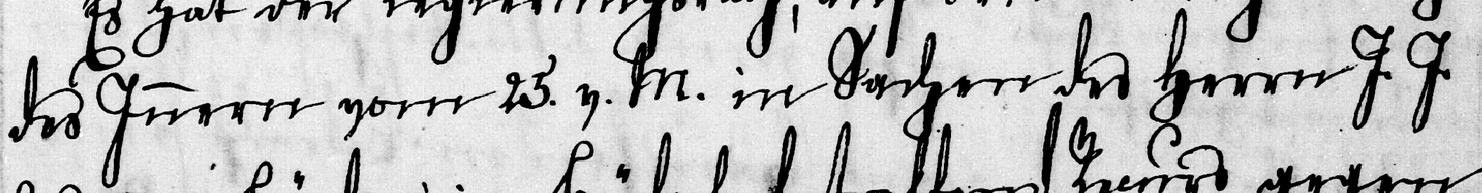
des Innern vom 25. v. M. in Sachen des Herrn J. J.
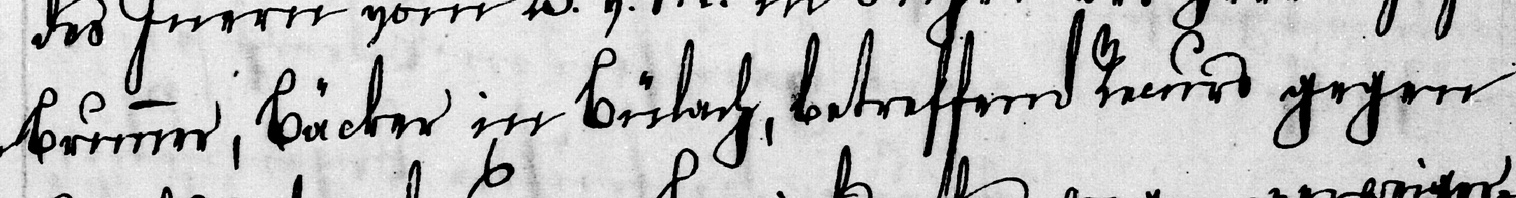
Brunner, Bäcker in Bülach, betreffend Recurs gegen
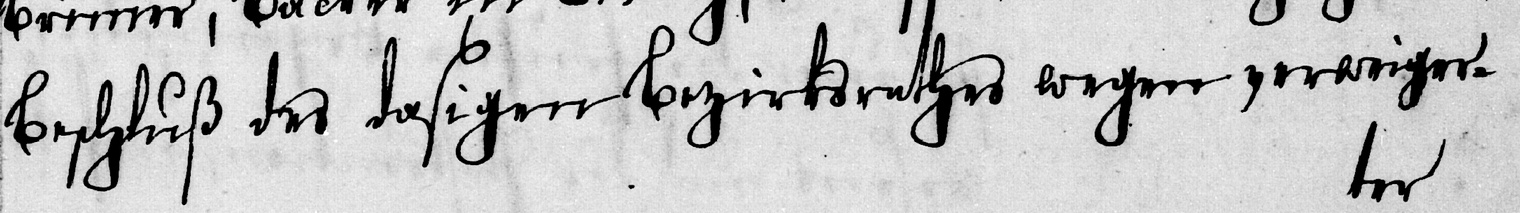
Beschluß des dasigen Bezirksrathes wegen verweiger-
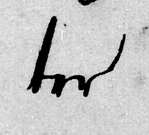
er,
